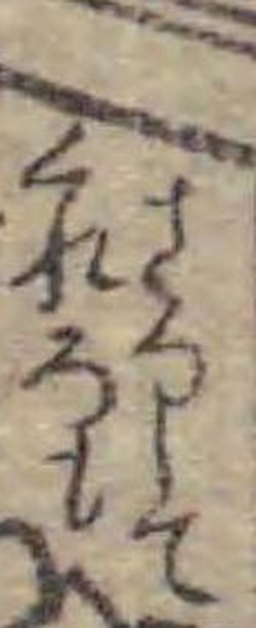くれろも
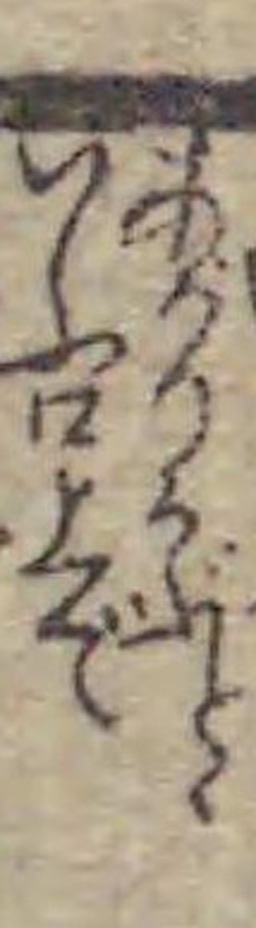いふ口上で
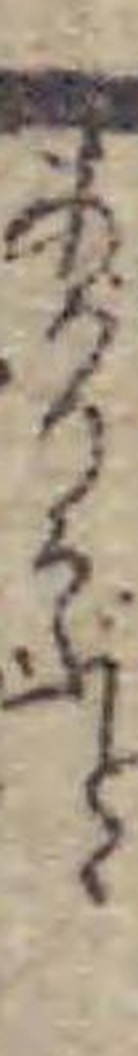あがりかぶとゝ
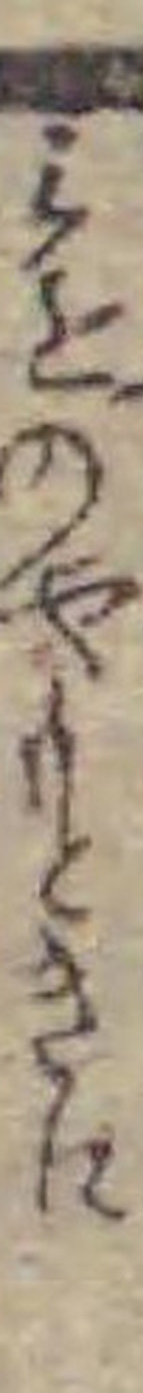みをのやもときに
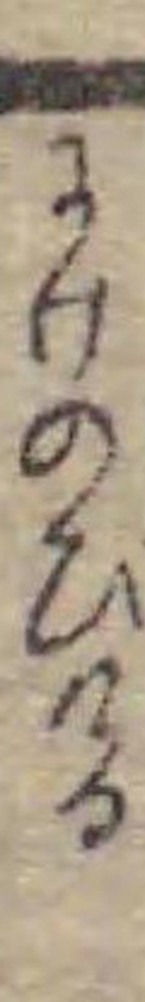にけのひける
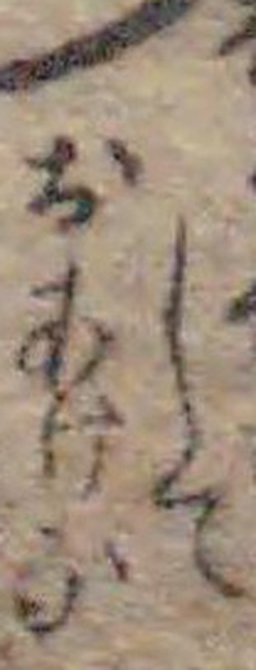おあけな

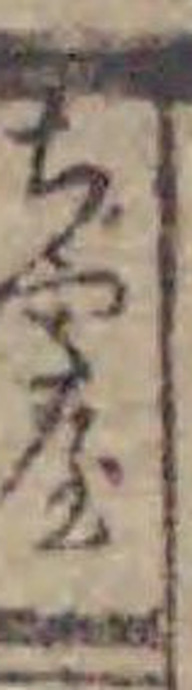ちや屋
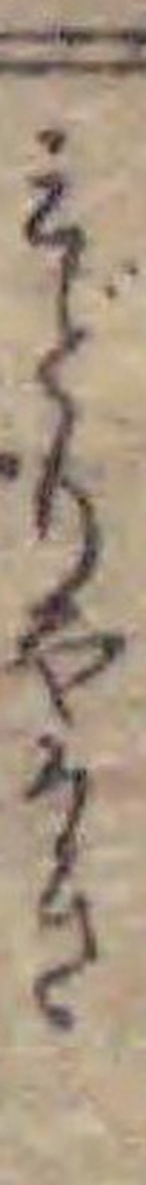みどりやかき
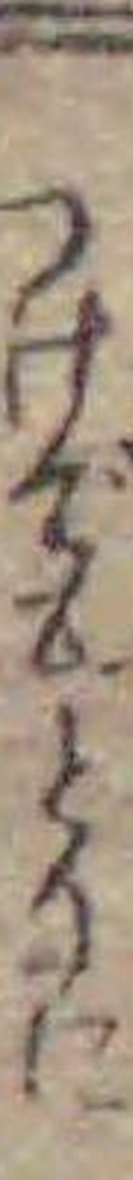つけでもとりに
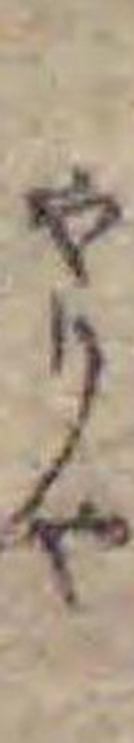やりや
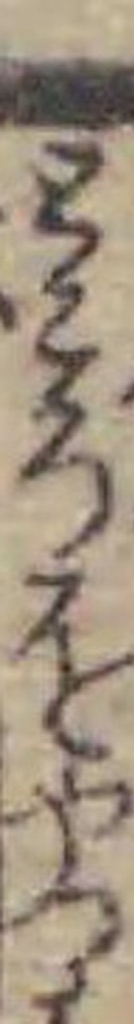ところをやつはり
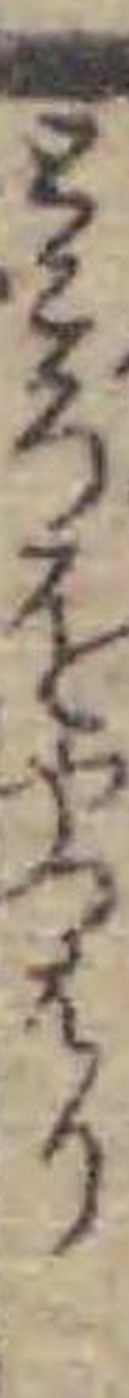ところをやつはり
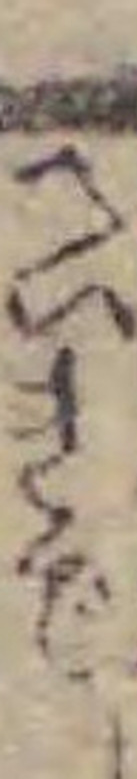へいきで
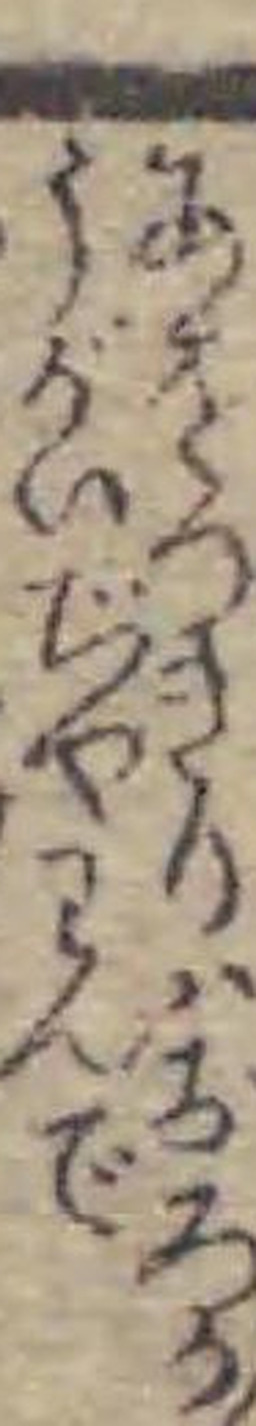うがいぢやわんで
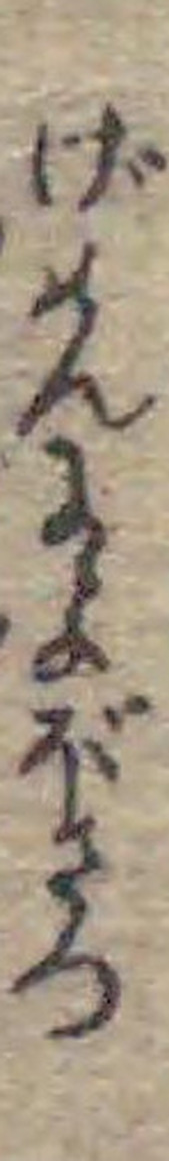げめんによぼさつ
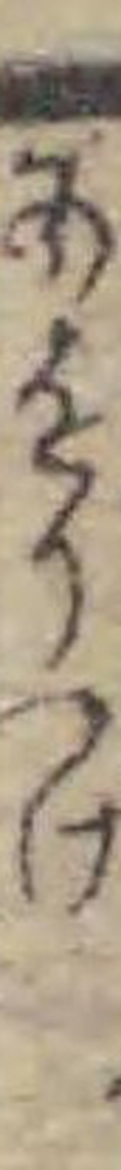あをりつけ
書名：江戸花俳優贔屓 : 3巻
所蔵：国立国会図書館 National Diet Library, JAPAN
